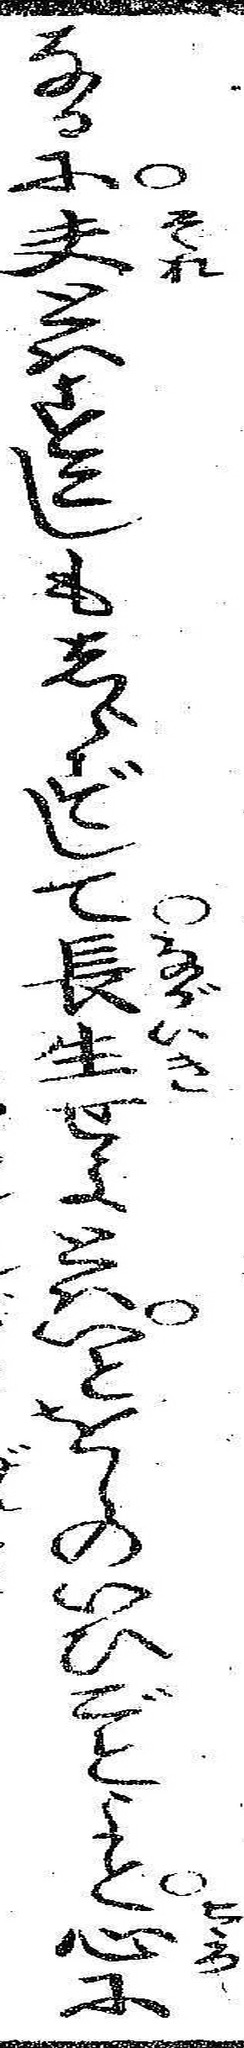なるに。夫とはすこしもしらずして。長生せよとは。いとをしのいひごとよと。心に
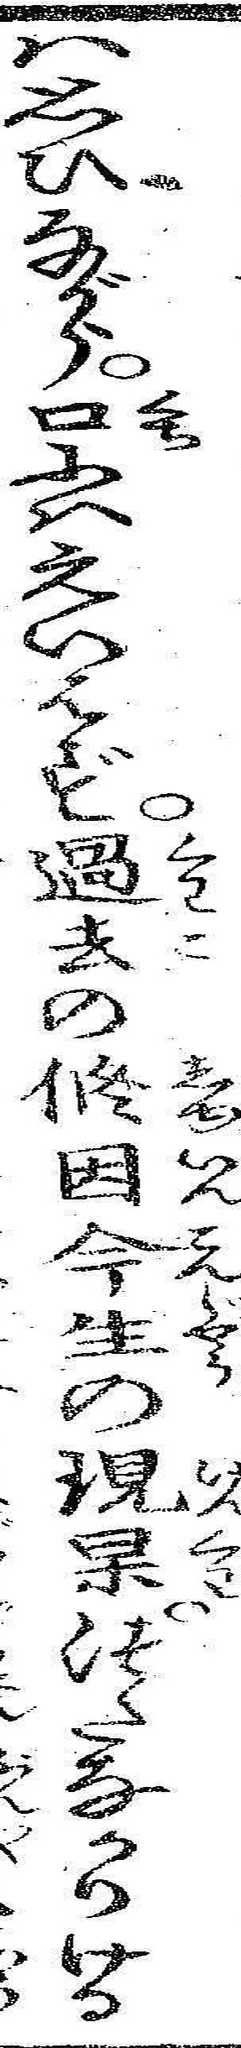は思ひながら。口にはえいはず。過去の修因今生の現果。つたなかりける
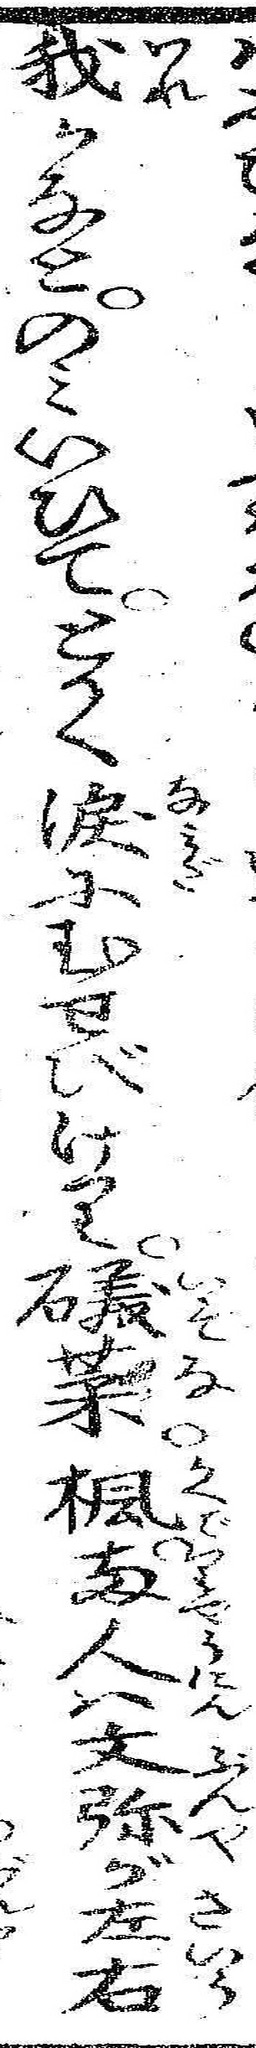我かなと。のみいひて。とかく涙にむせびけり。礒菜。楓。両人は文弥が左右
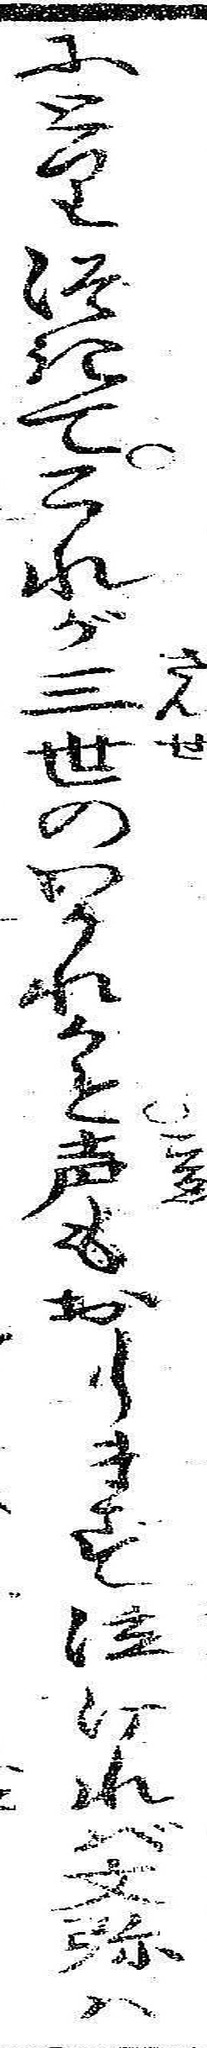にとりつきて。これが三世のわかれかと。声もおしまず泣ければ。文弥は
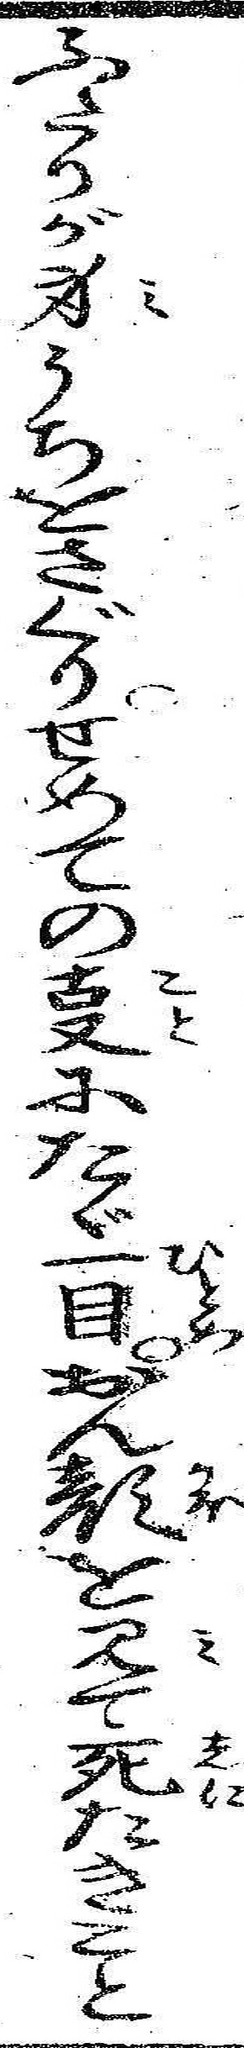ふたりが身うちをさぐり。せめての事にたゞ一目。おん顔を見て死たきこと
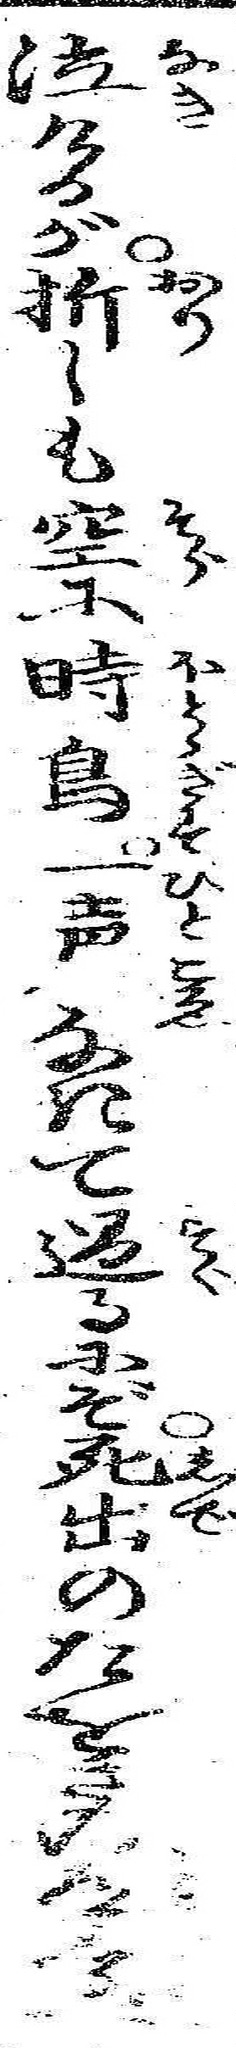泣けるが。折しも空に時鳥。一声なきて過るにぞ。死出のたをさの道しるべ
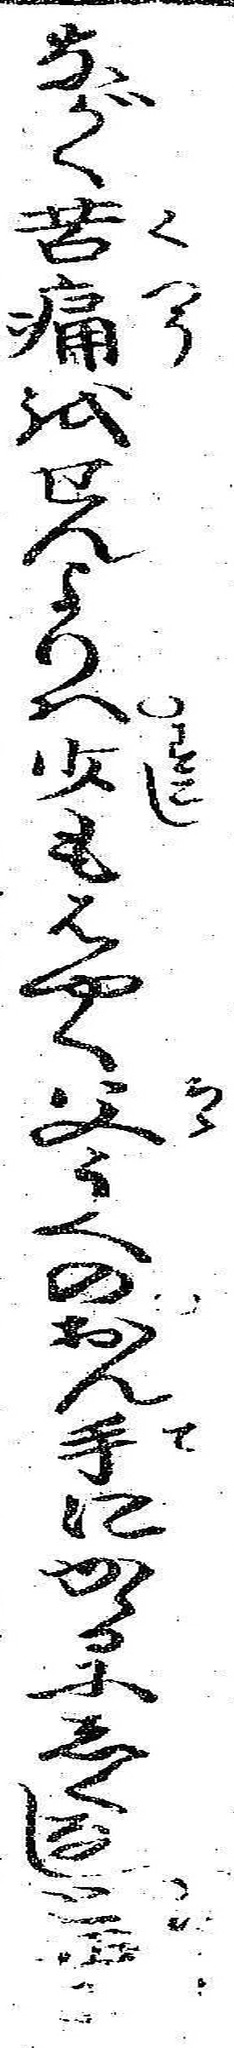ながく苦痛をせんよりは。少もはやく父うへの。おん手にかゝるにしくなしと。西に
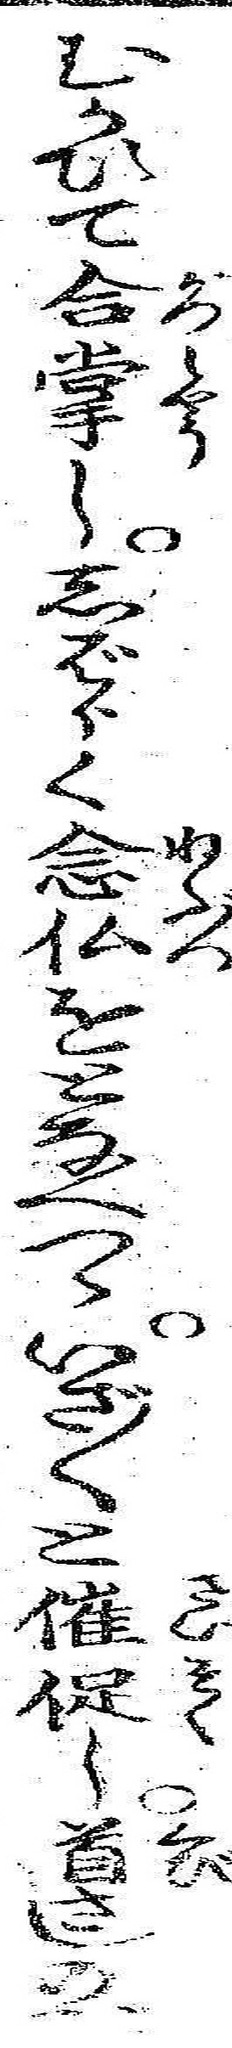むかひて合掌し。しばらく念仏をとなへつゝ。いざ〳〵と催促し。首さしのべ
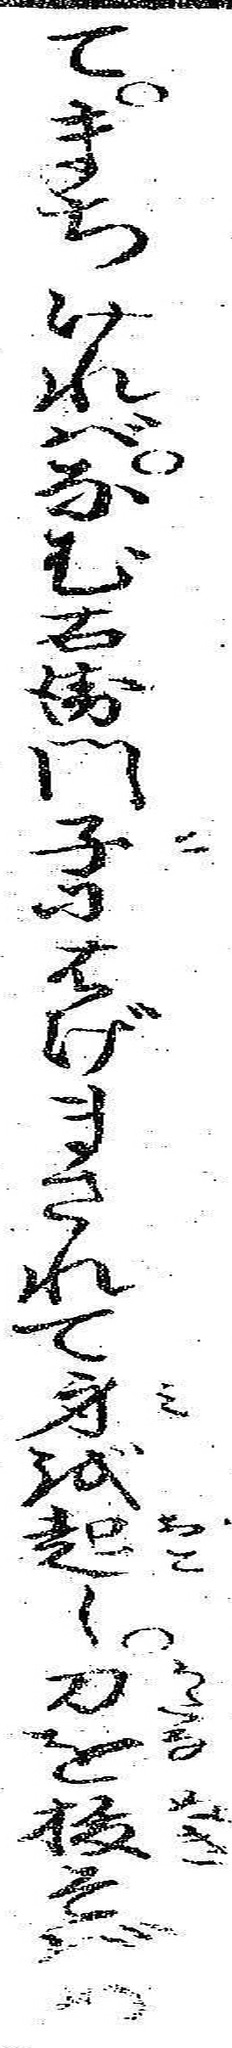て。まちければ。なむ右衛門子にはげまされて身を起し。刀を抜そばめ
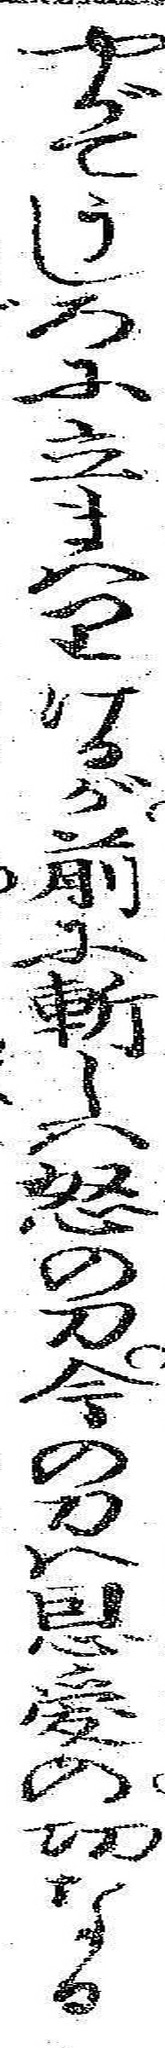やがてうしろに立まはりけるが。前に斬しは怒の刀。今の刀は恩愛の。切なる
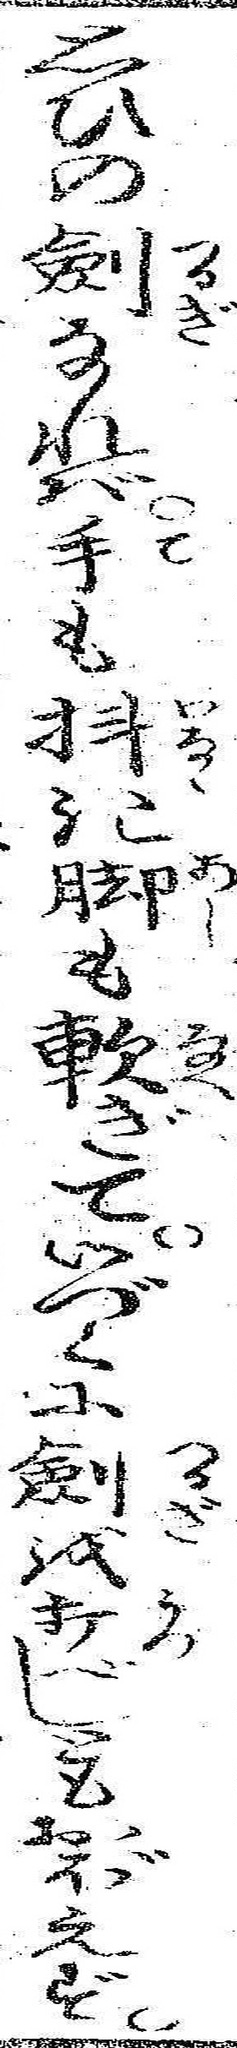思ひの剣なれば。手も抖き脚も軟ぎて。いづくに剣を打べしともおぼえず。
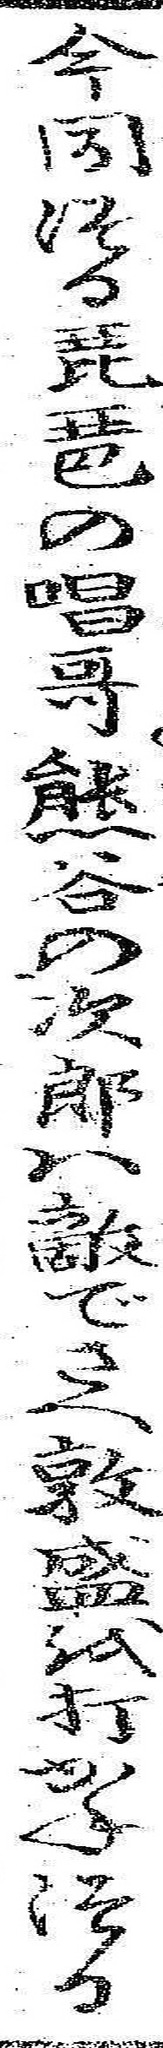今聞つる琵琶の唱歌。熊谷の次郎は敵でさへ。敦盛を打かねつる
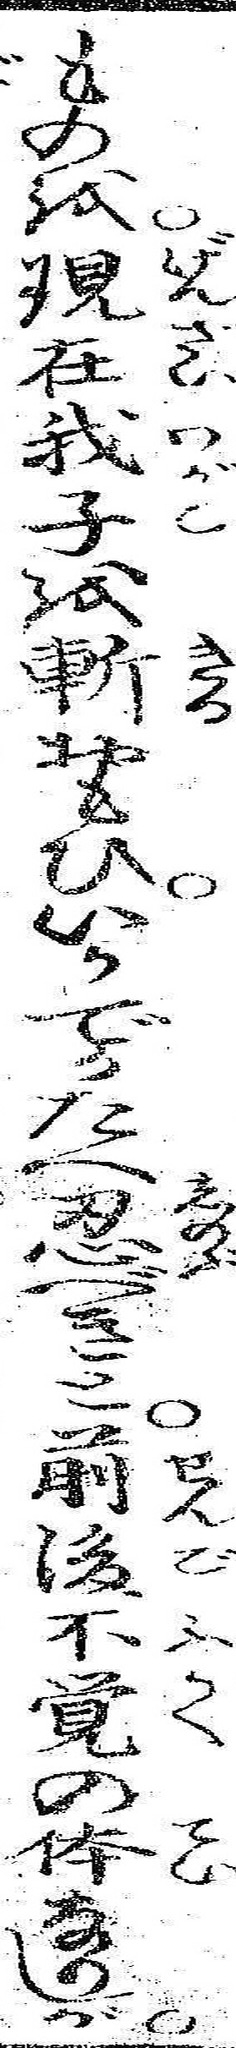ものを。現在我子を斬おもひ。いかでかたへ忍べきと。前後不覚の体なりしが。
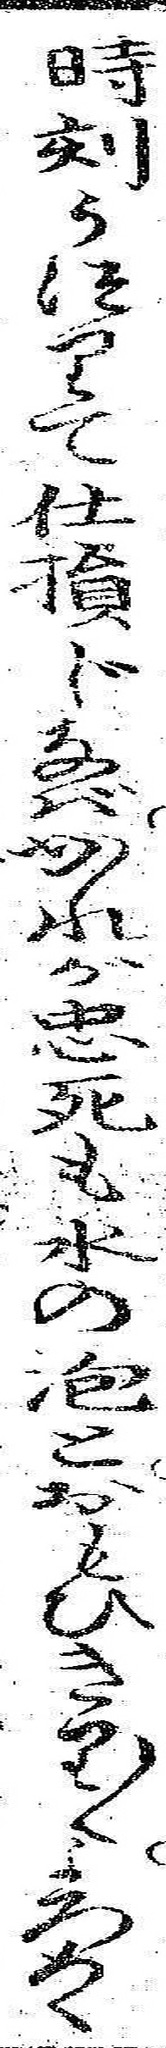時刻うつりて仕損じなば。かれが忠死も水の泡と。おもひきり〳〵。よろめく
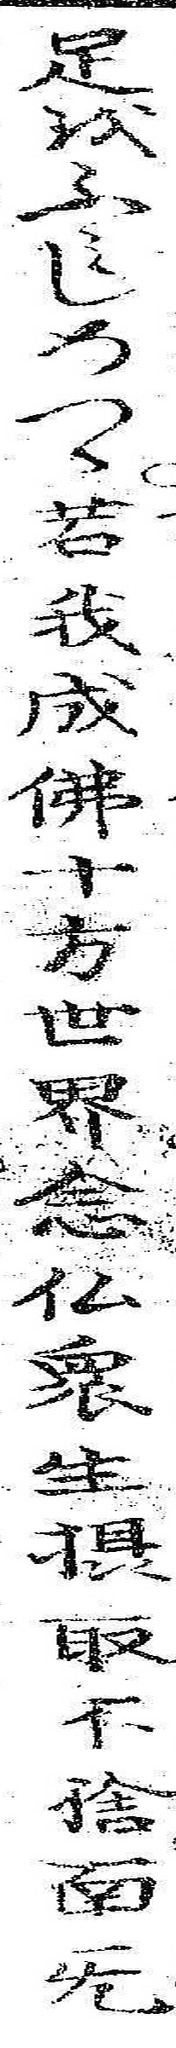足をふみしめつゝ。若我成仏十方世界。念仏衆生摂取不捨。南無

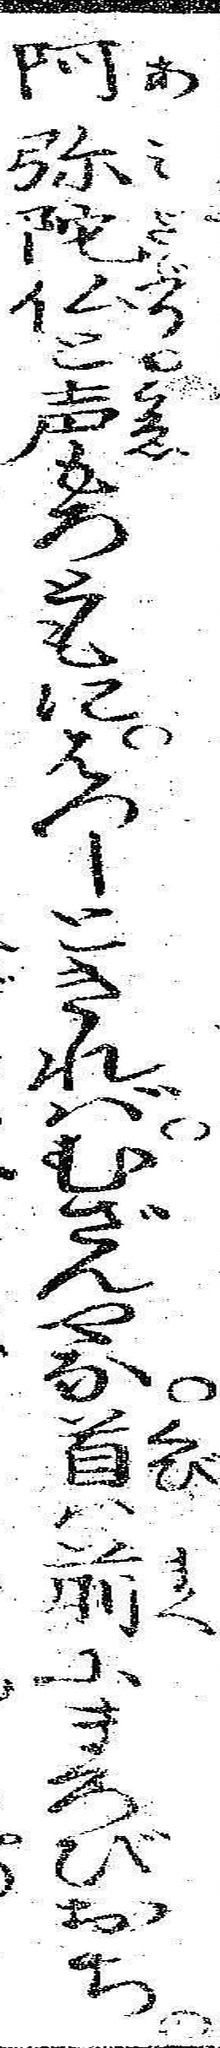阿弥陀仏と。声もろともに。はつしときれば。むざんやな。首は前にまろびおち。
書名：昔話稲妻表紙
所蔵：国文学研究資料館
